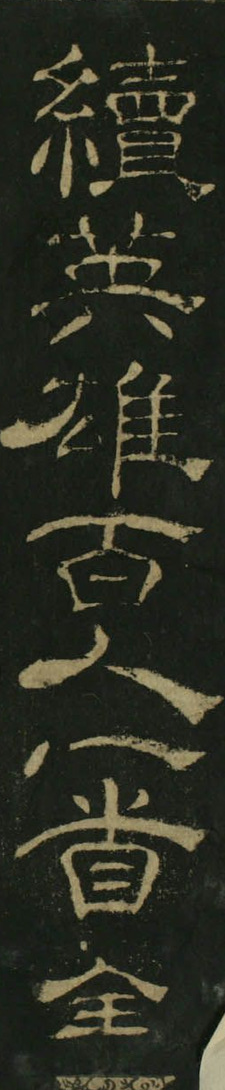續英雄百人一首全
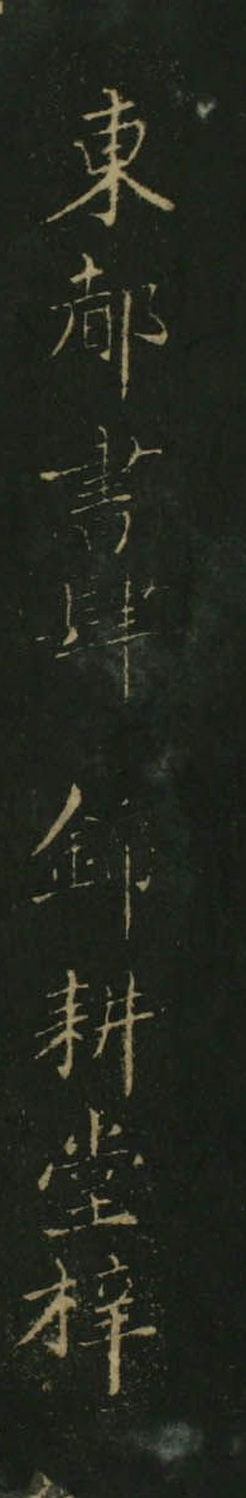東都書肆錦耕堂梓
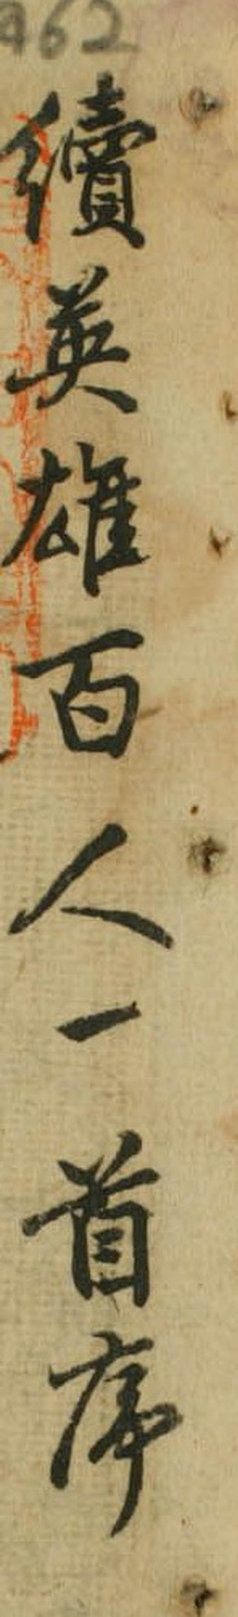續英雄百人一首序
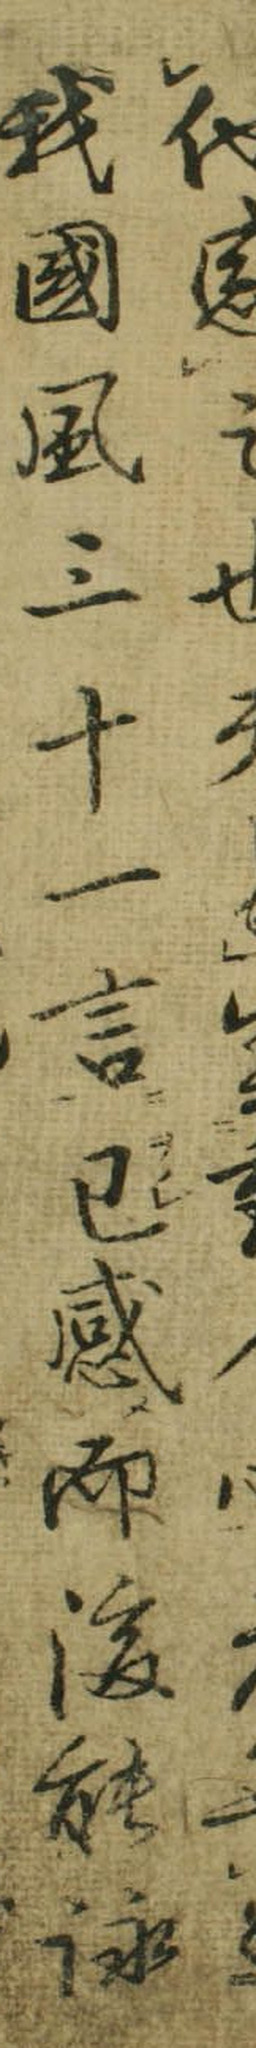我國風三十一言己感而後能詠

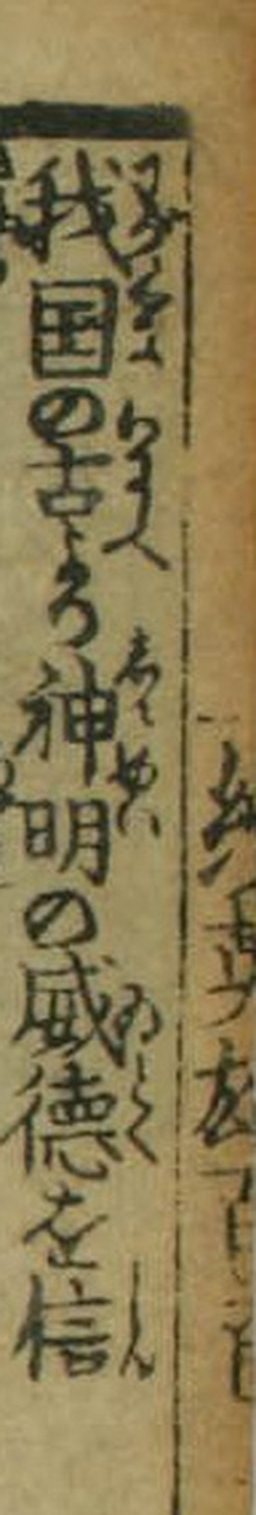我国の古より神明の威徳を信
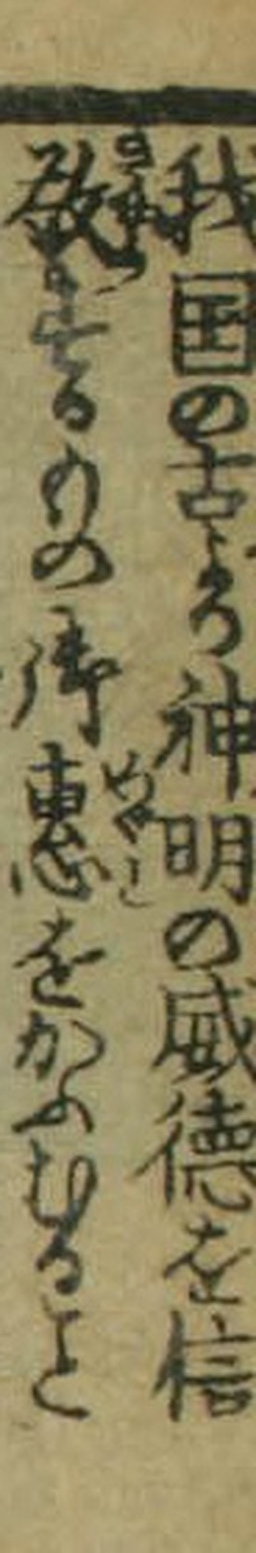敬するもの御恵をかふむること
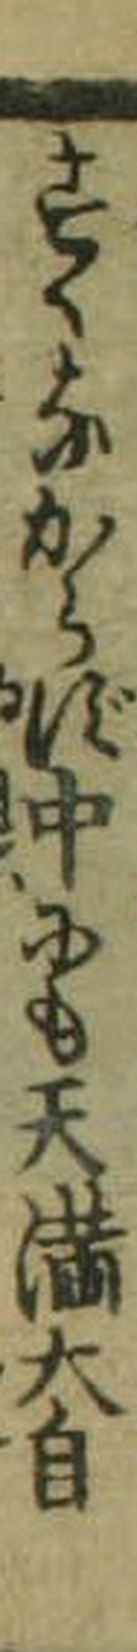すくなからず中にも天満大自
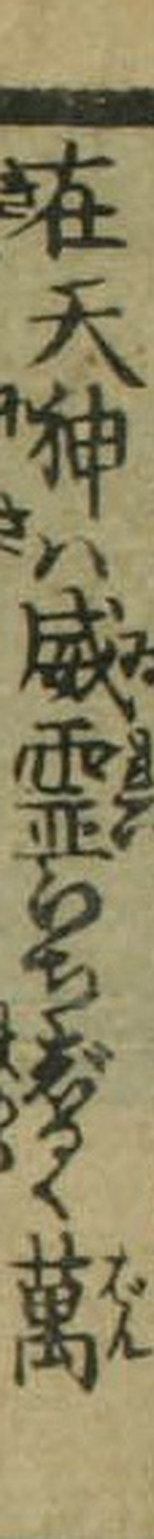在天神は威霊いちじるく萬
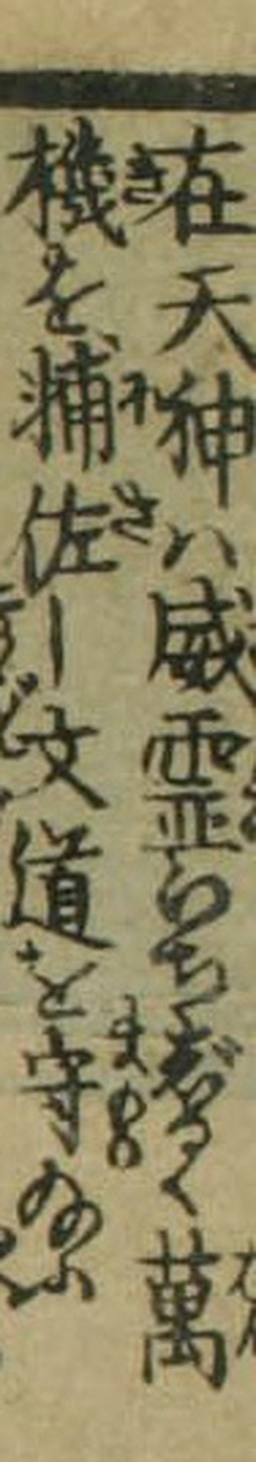機を輔佐し文道を守給ふ
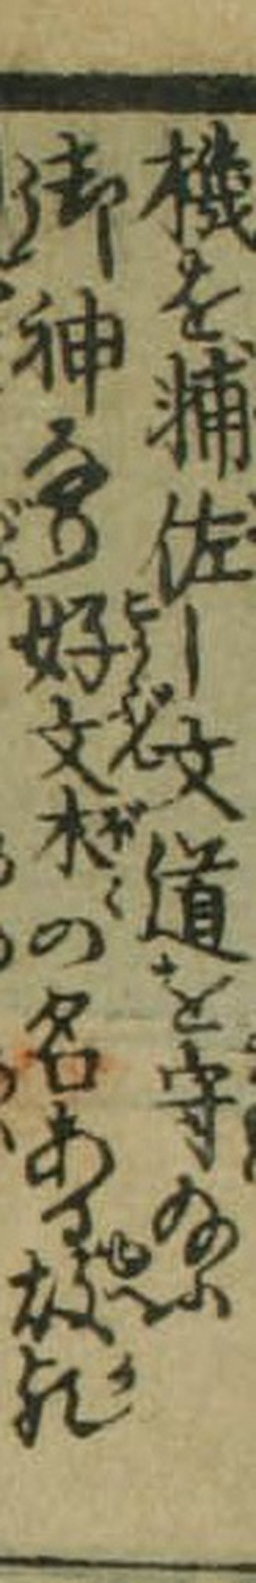御神なり好文木の名ある故歟
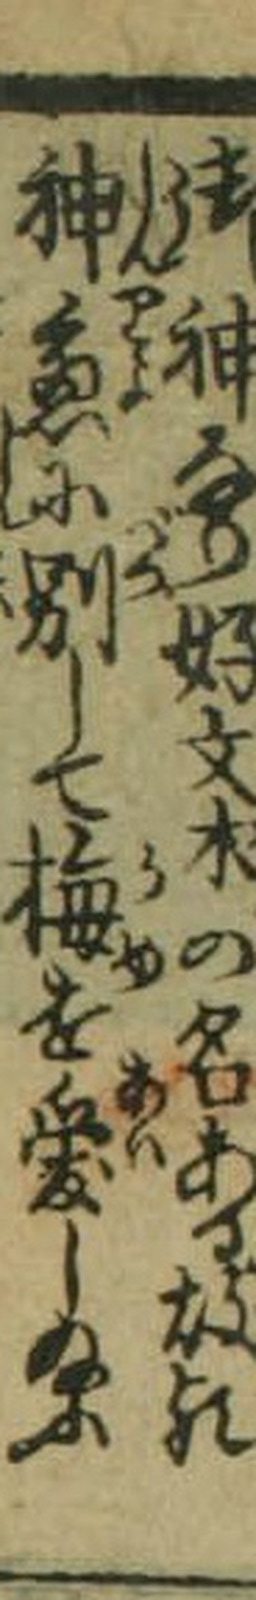神慮に別して梅を愛し給ふ
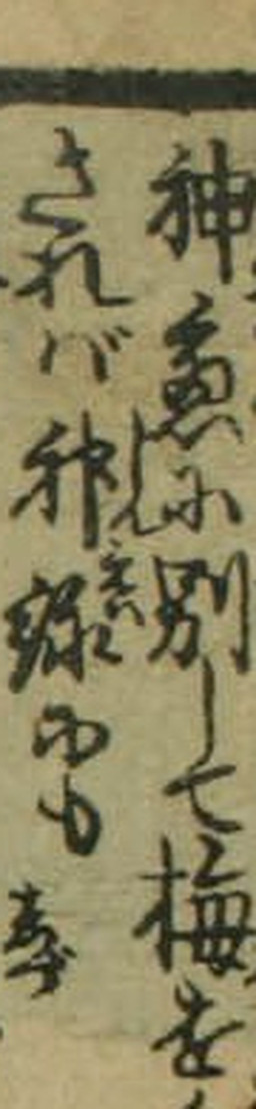されば神詠にも
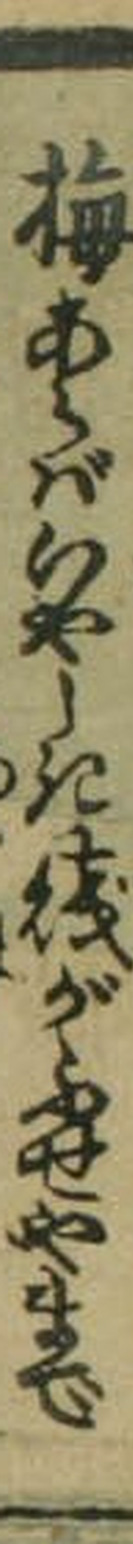梅あらばいやしき賤がふせやまで
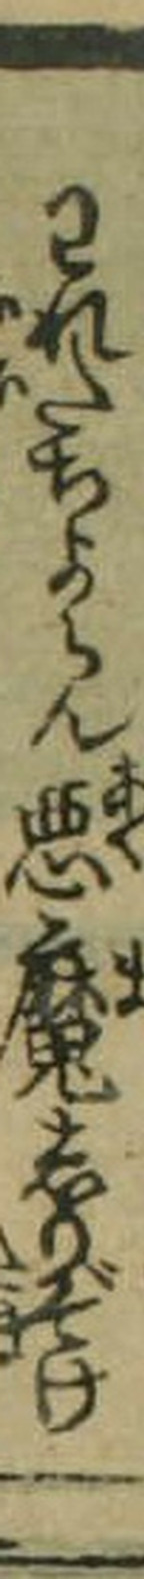われたちよらん悪魔しりぞけ
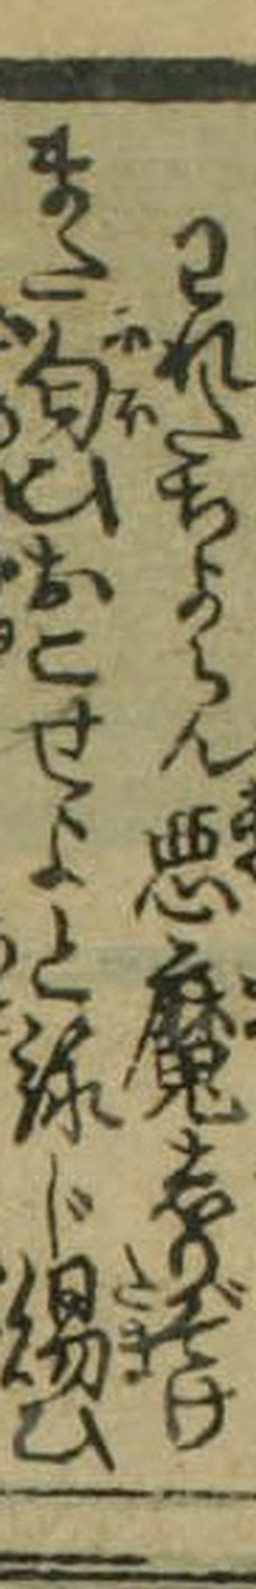また匂ひおこせよと詠じ賜ひ
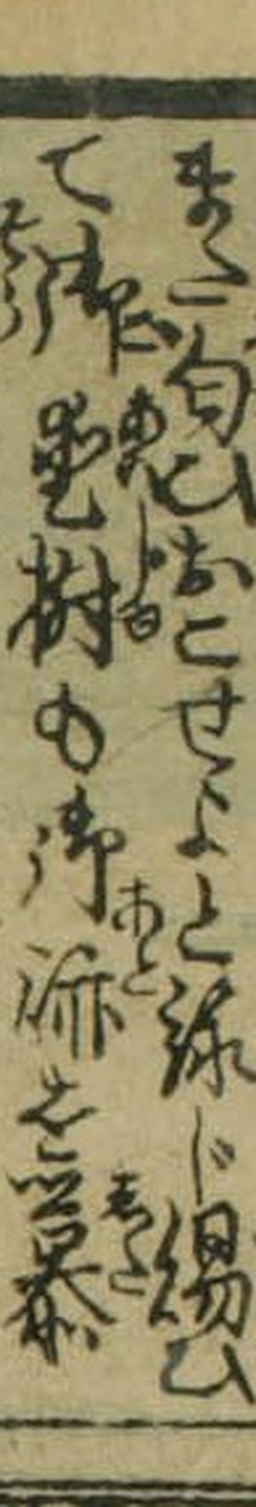て御愛樹も御跡を慕
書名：續英雄百人一首
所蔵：東京学芸大学附属図書館
